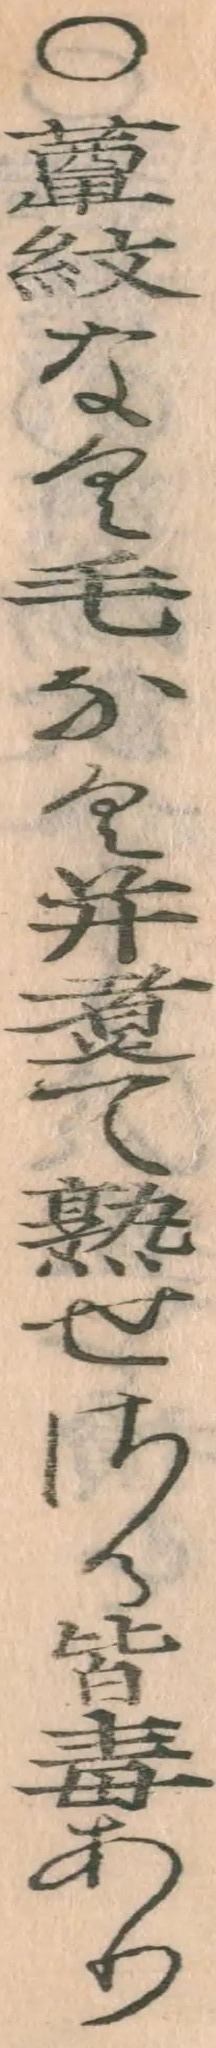〇蕈紋なく毛なく并煮て熟せさる皆毒あり
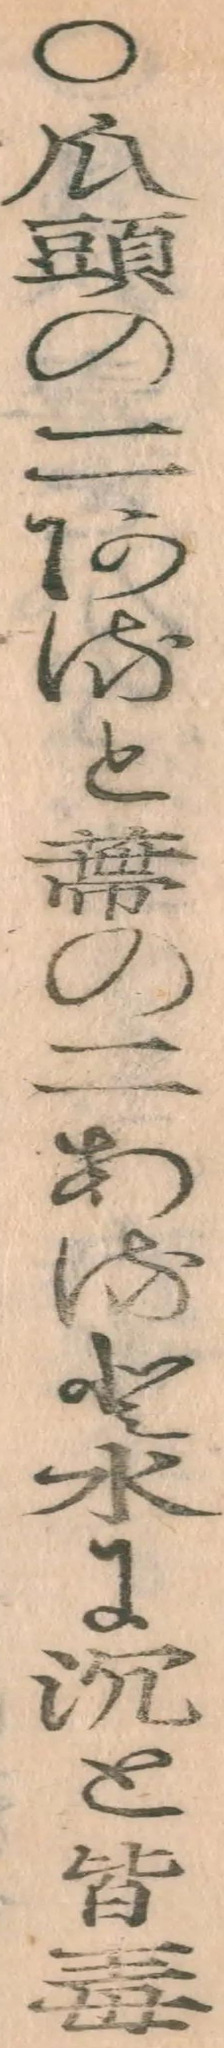〇瓜頭の二あると帯のにあると水に沈と皆毒
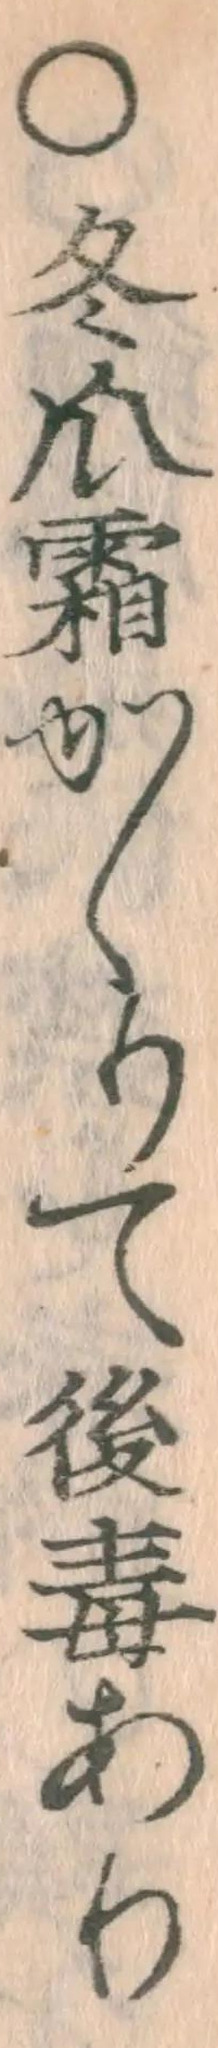〇冬瓜霜かゝりて後毒あり
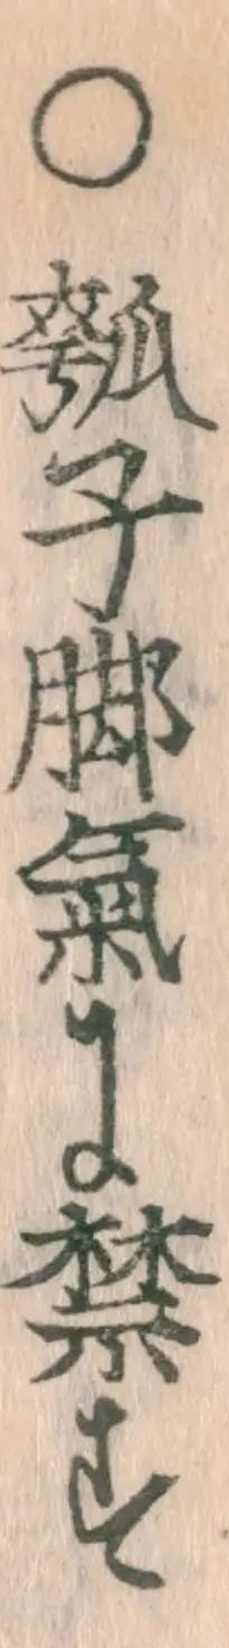〇瓠子脚気に禁す
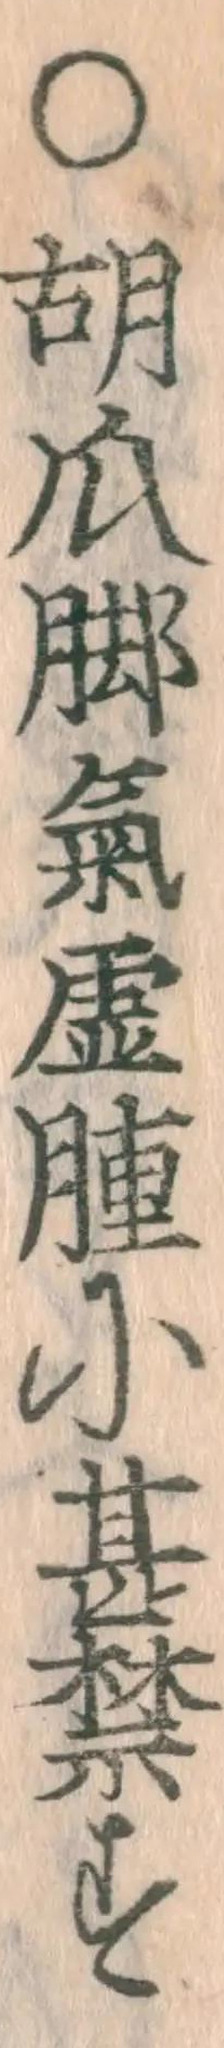〇胡瓜脚気虚腫に甚禁す
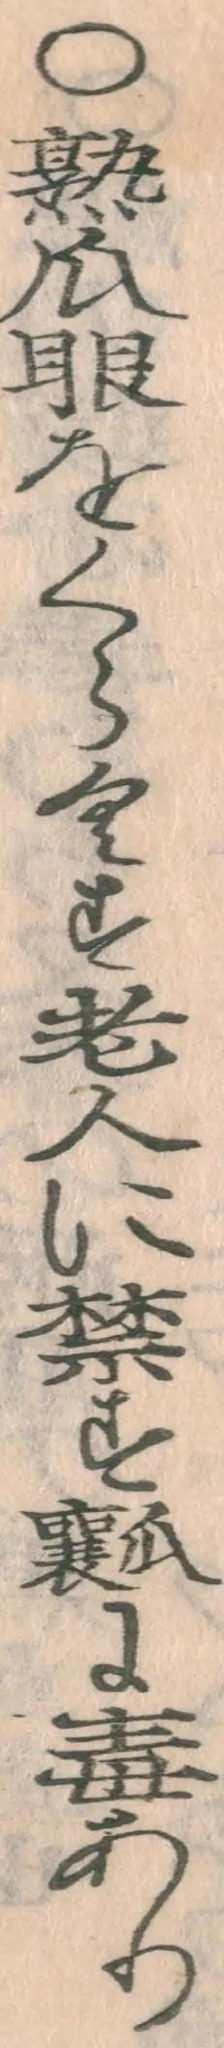〇熟瓜眼をくらくす老人に禁す瓤に毒あり
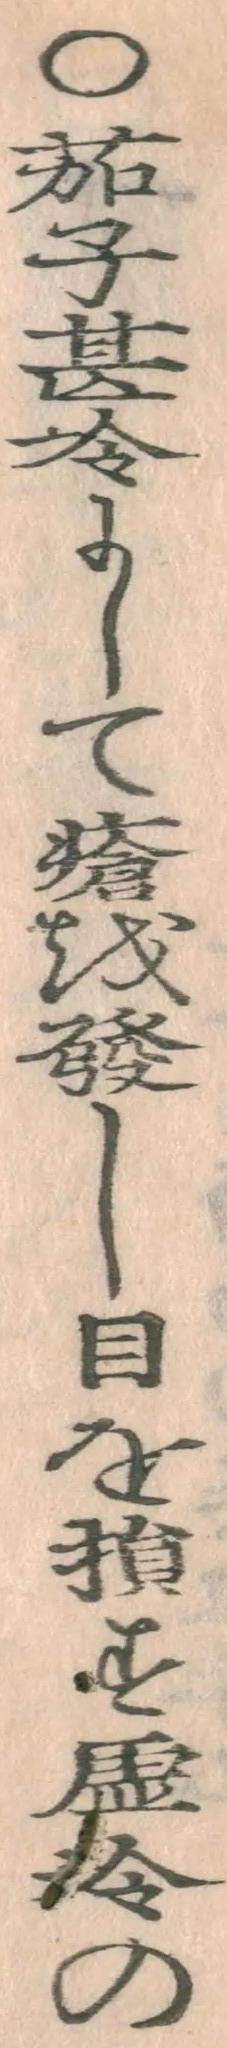〇茄子甚冷にして瘡を発し目を損す虚冷の
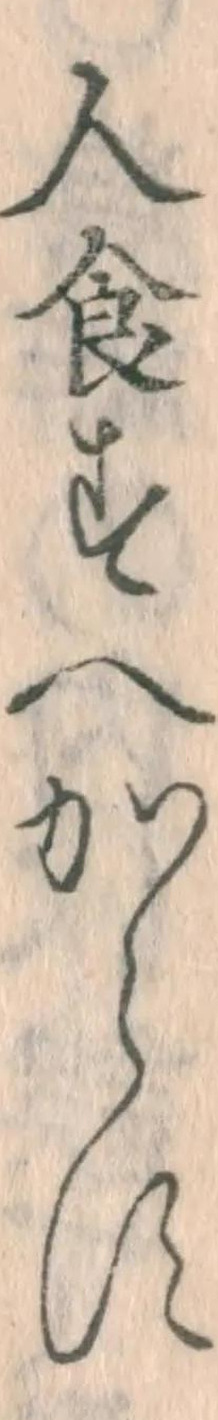人食すへからす
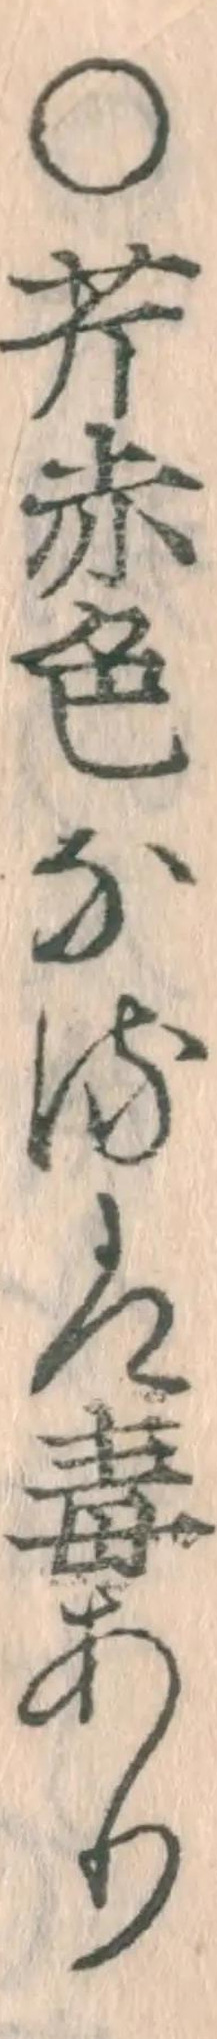〇芹赤色なるは毒あり
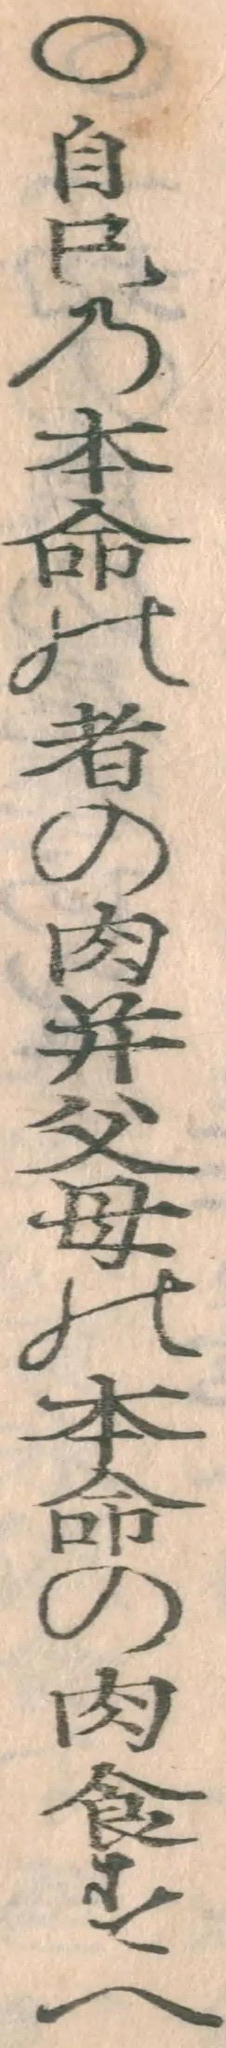〇自己の本命の者の肉并父母の本命の肉食すへ
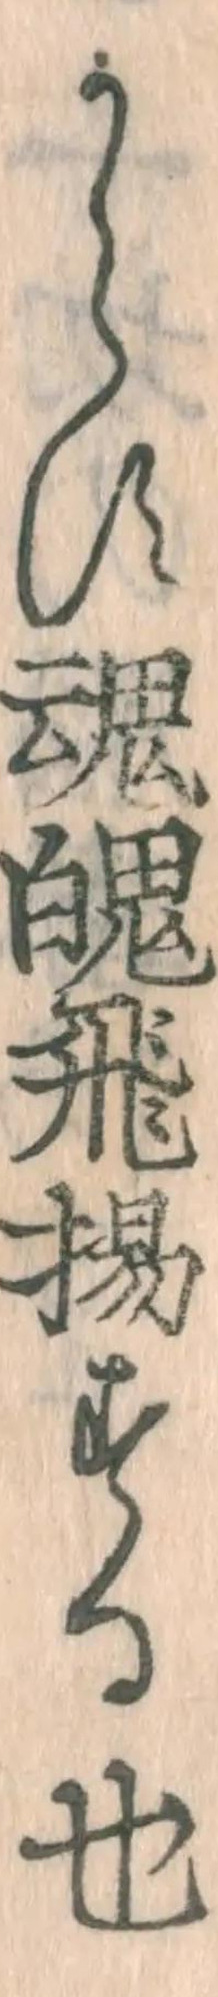からす魂魄飛揚する也

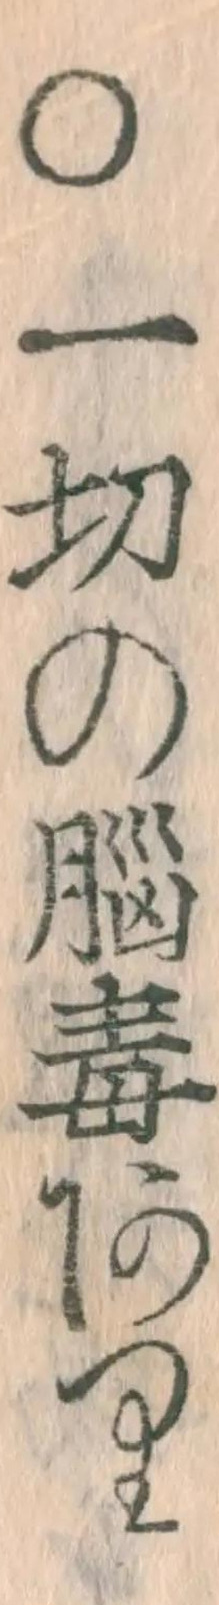〇一切の脳毒あり
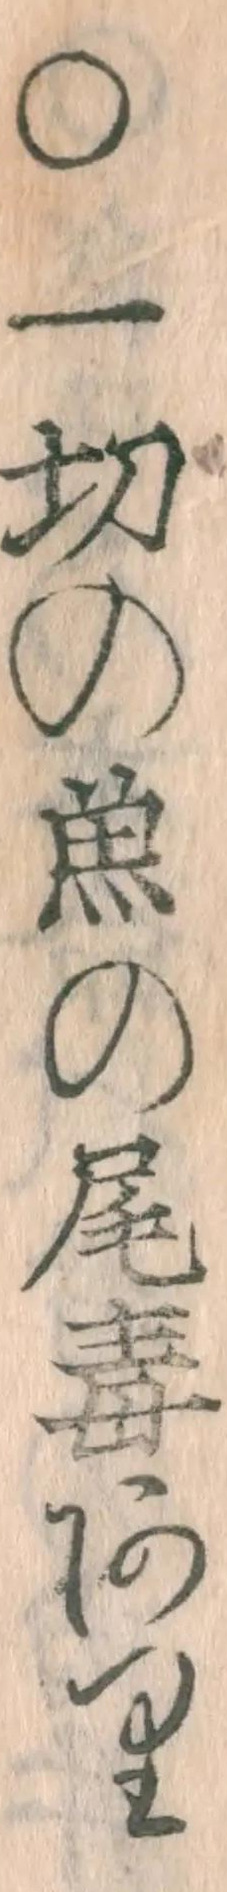〇一切の魚の尾毒あり
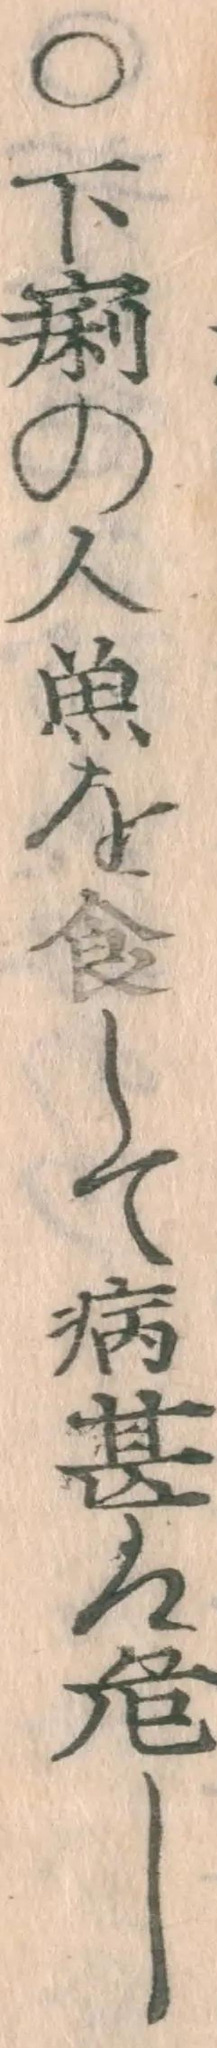〇下痢の人魚を食して病甚は危し
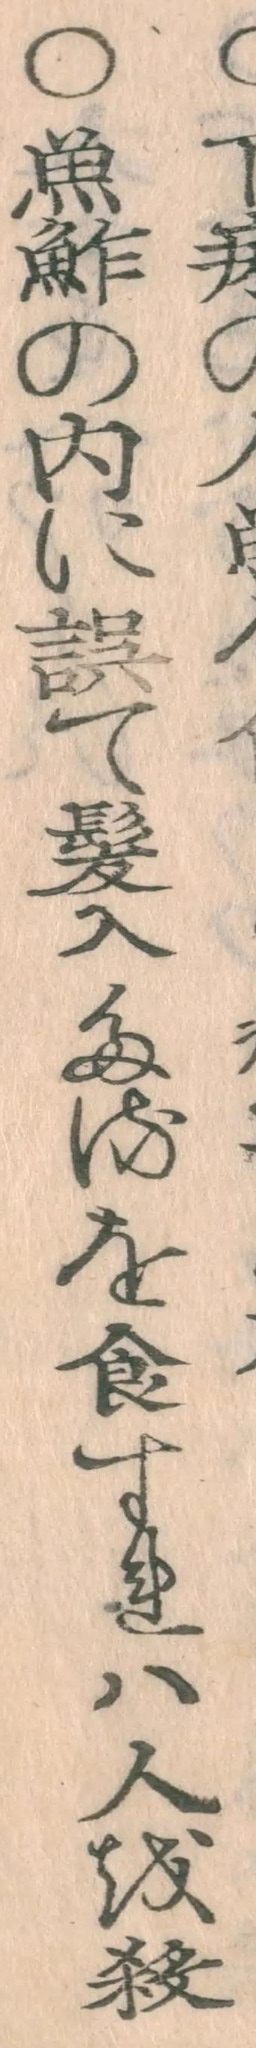〇魚鮓の内に誤て髪入たるを食すれは人を殺
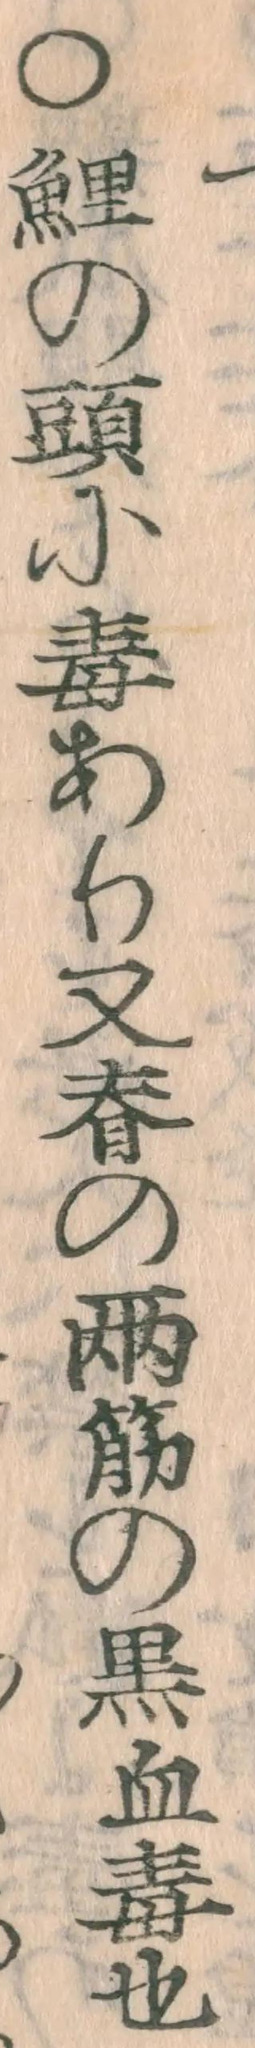〇鯉の頭に毒あり又背の両筋の黒血毒也
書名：延壽撮要
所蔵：国立国会図書館 National Diet Library, JAPAN
